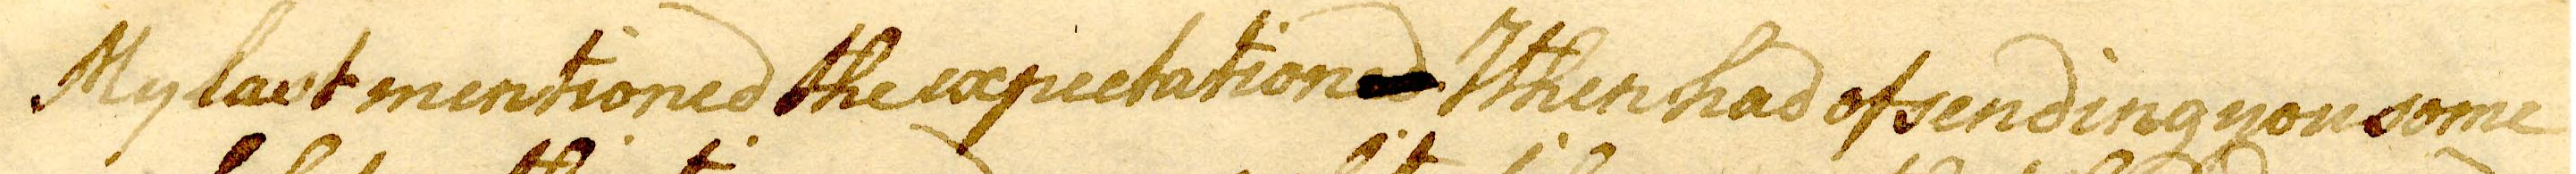My last mentioned the expectation[ed] I then had of sending you some
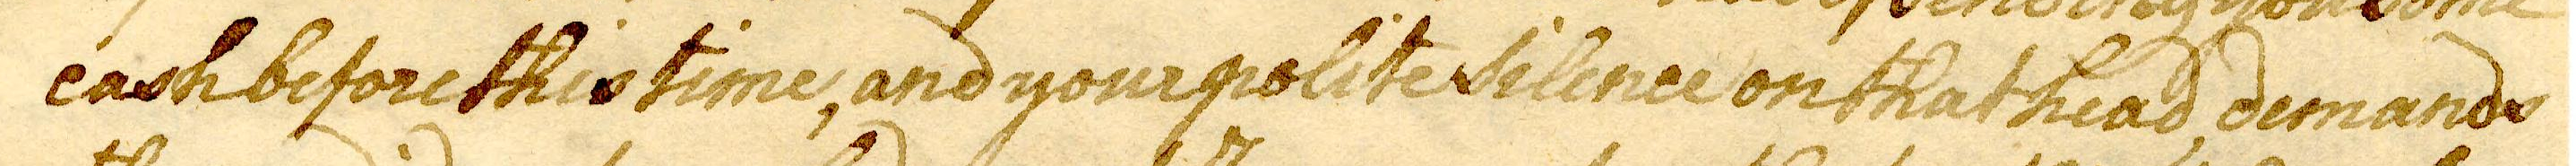cash before this time, and your polite silence on that head, demands
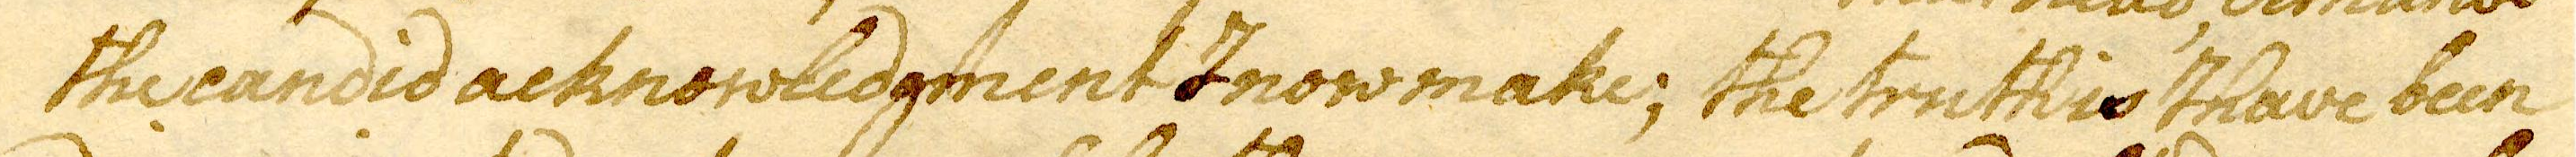The candid acknowledgment I know make; the truth is I have been
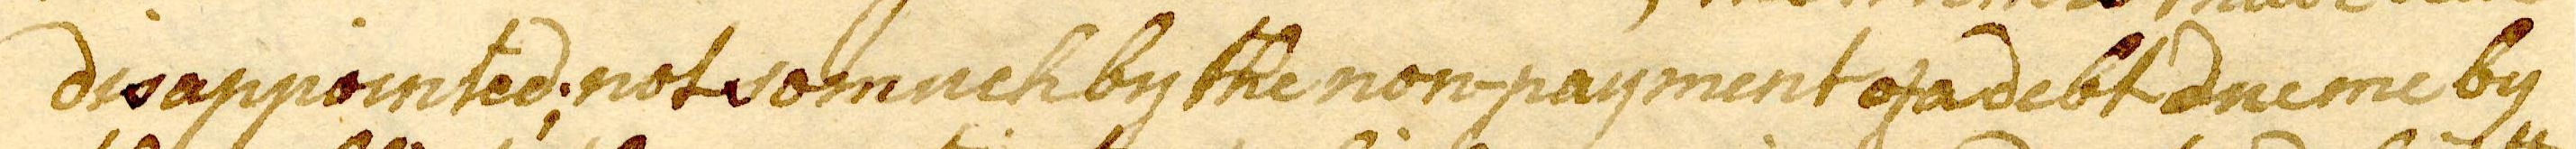disappointed; not so much by the non-payment of a debt due me by
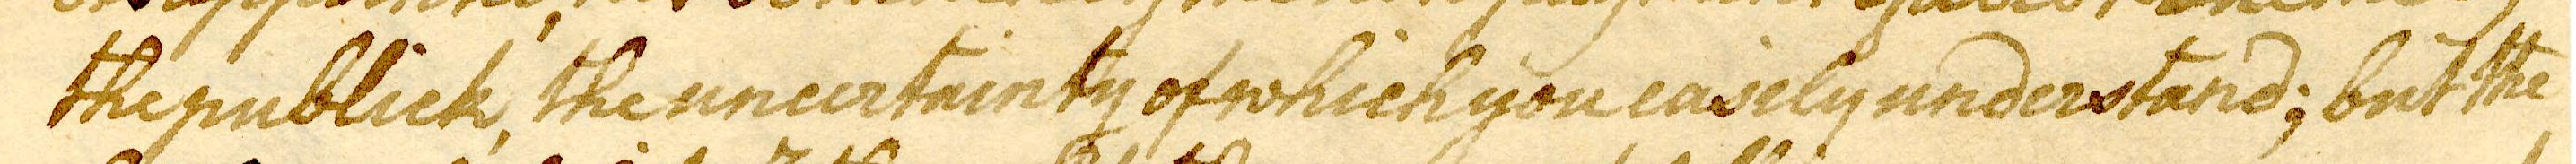the publick, the uncertainty of which you easily understand; but the
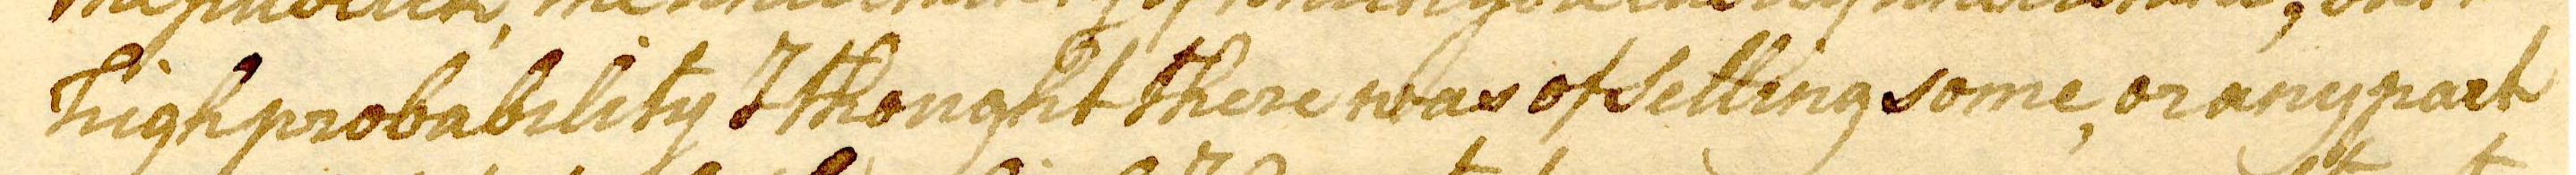high probability I thought there was of selling some or any part
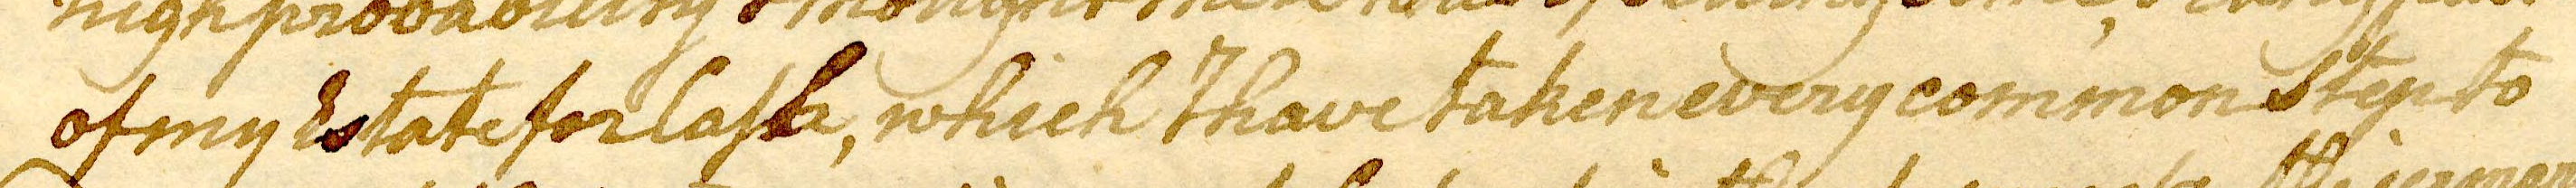of my Estate for Cash, which I have taken every common step to
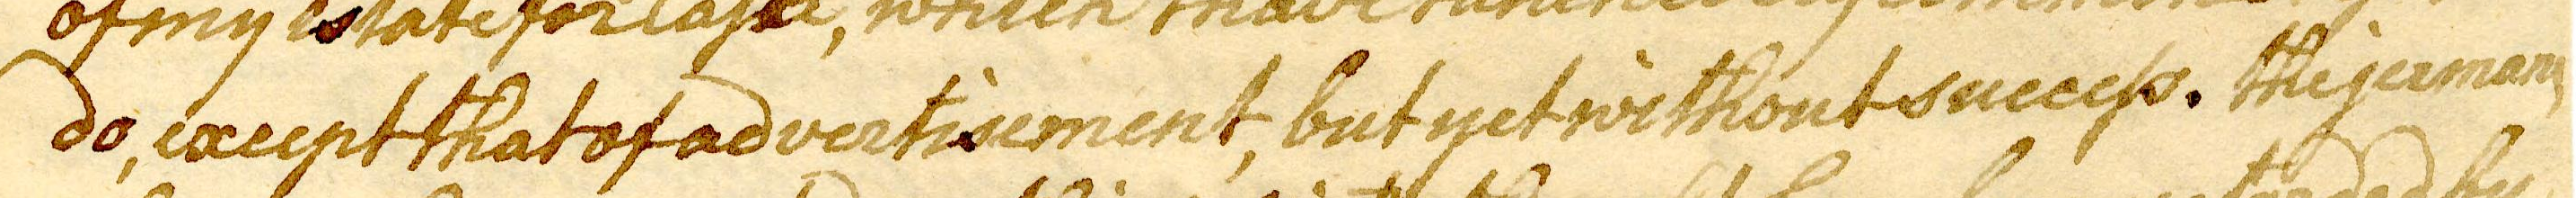do, except that of advertisement, but yet without success. the jermans
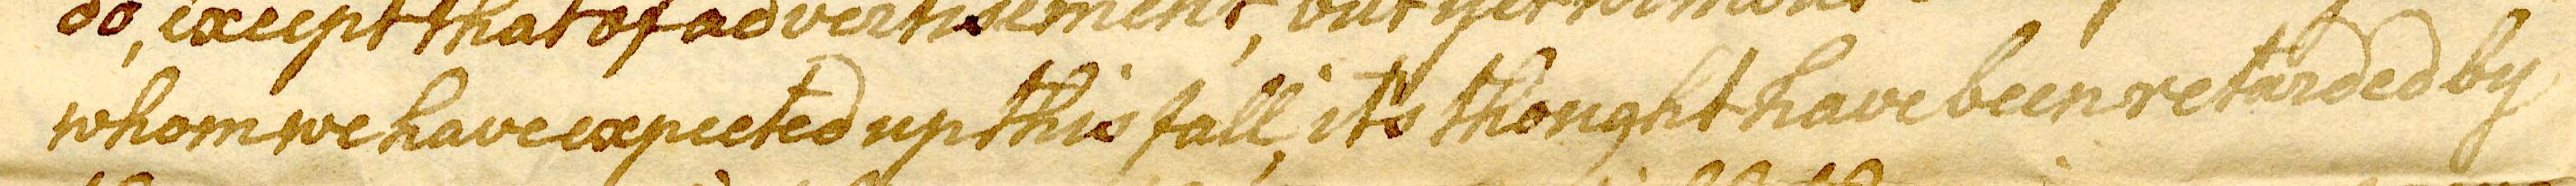whom we have expected up this fall, it's thought have been retarded by
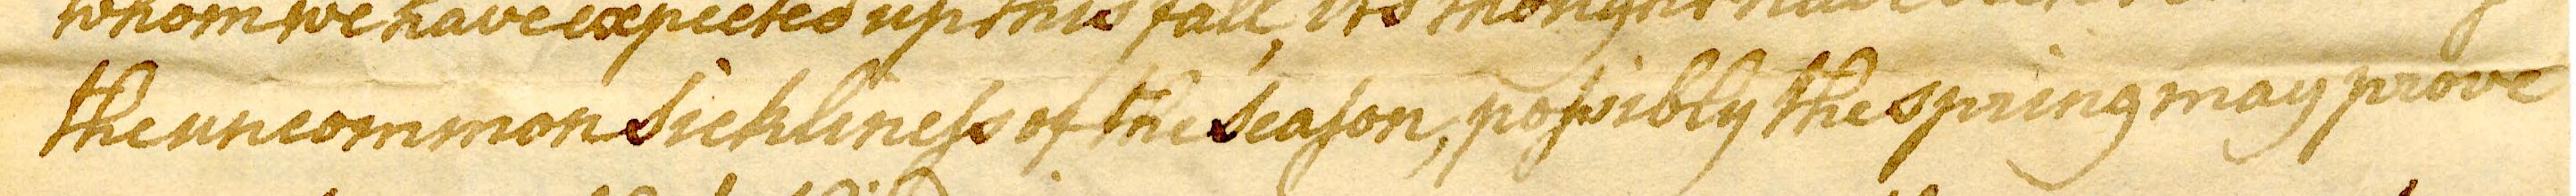the uncommon sickliness of the season, possibly the spring may prove
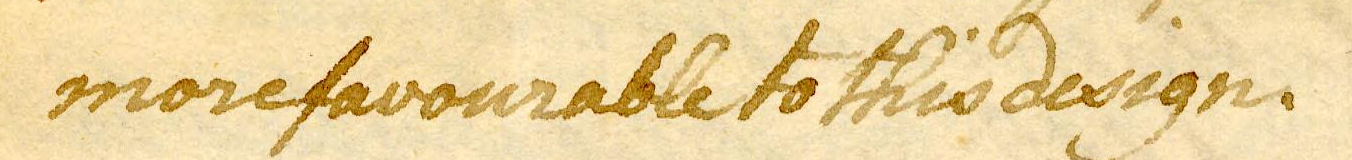more favourable to this design.
